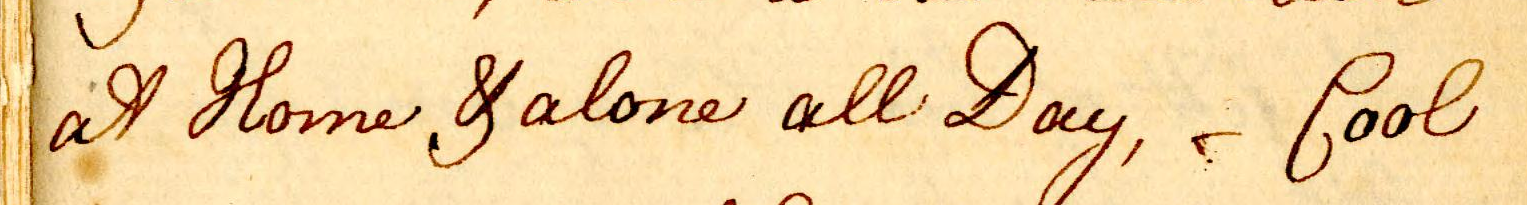at Home, & alone all Day- Cool
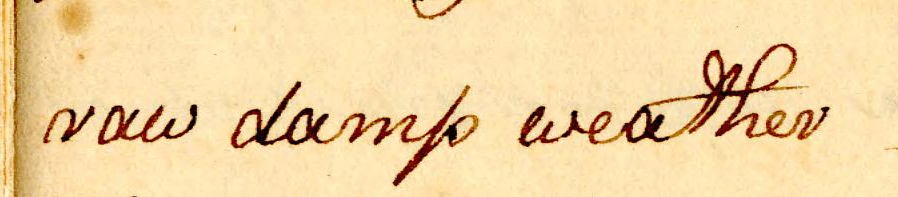raw damp weather
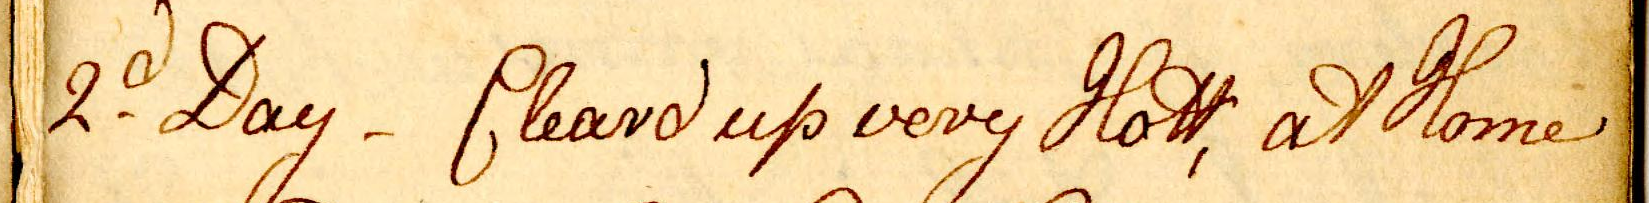2^d Day- Cleard up very Hott, at Home
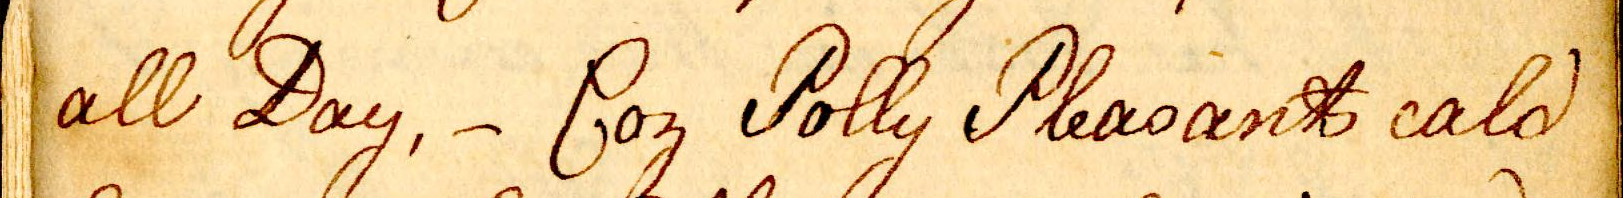all Day- Coz Polly Pleasants cald
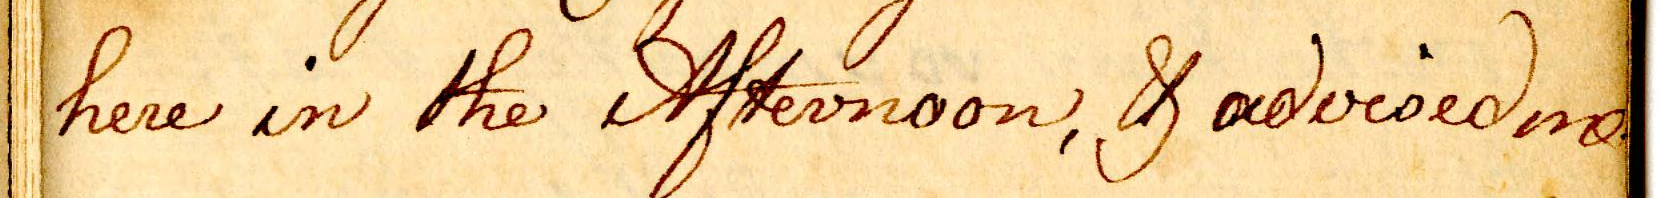here in the Afternoon, & advised me
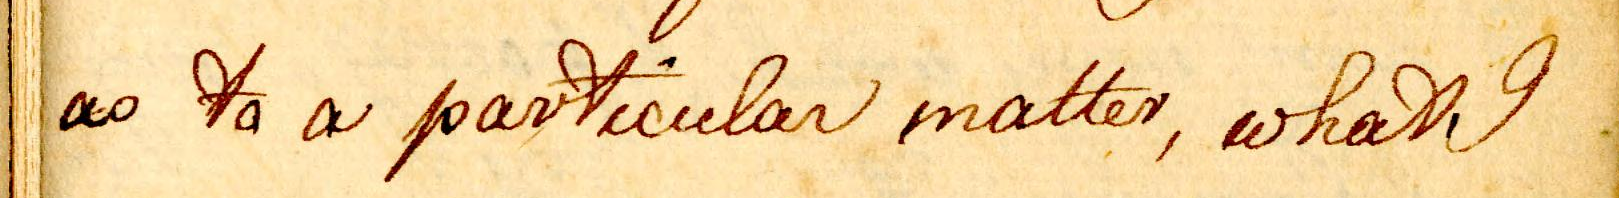as to a particular matter, what I
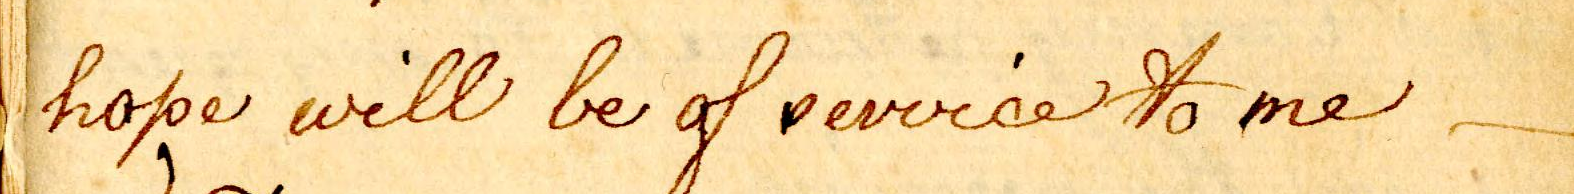hope will be of service to me
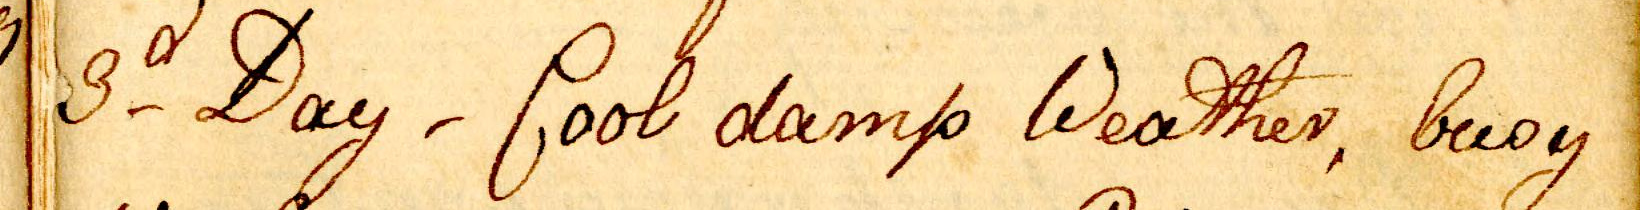3^d Day- Cool damp Weather, busy
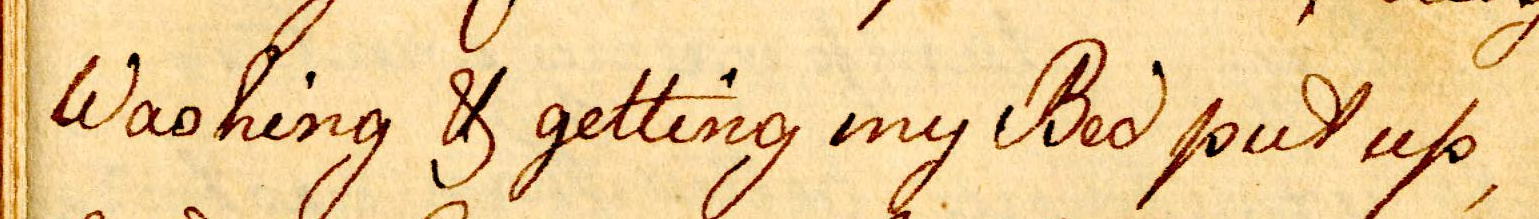Washing & getting my Bed put up,
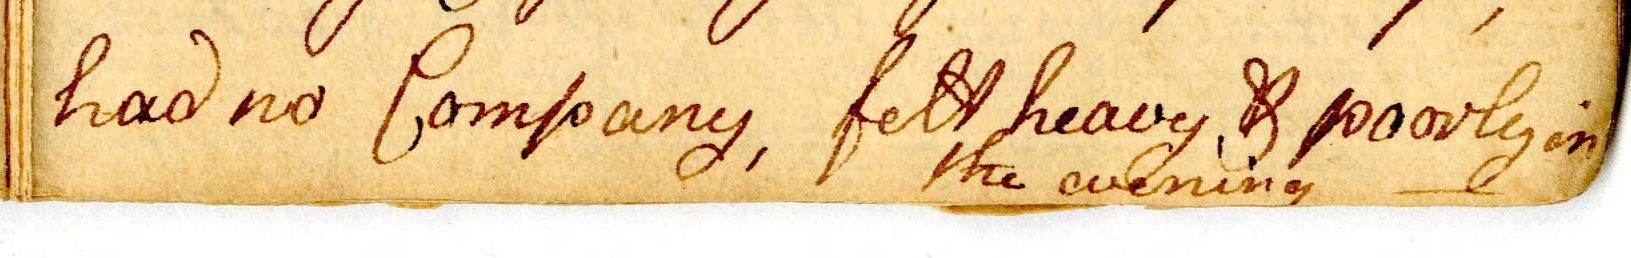had no Company, felt heavy & poorly in
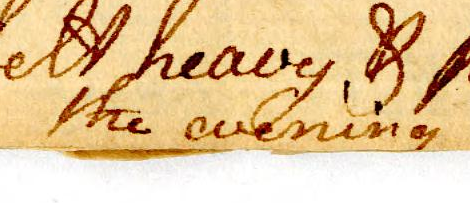the evening
